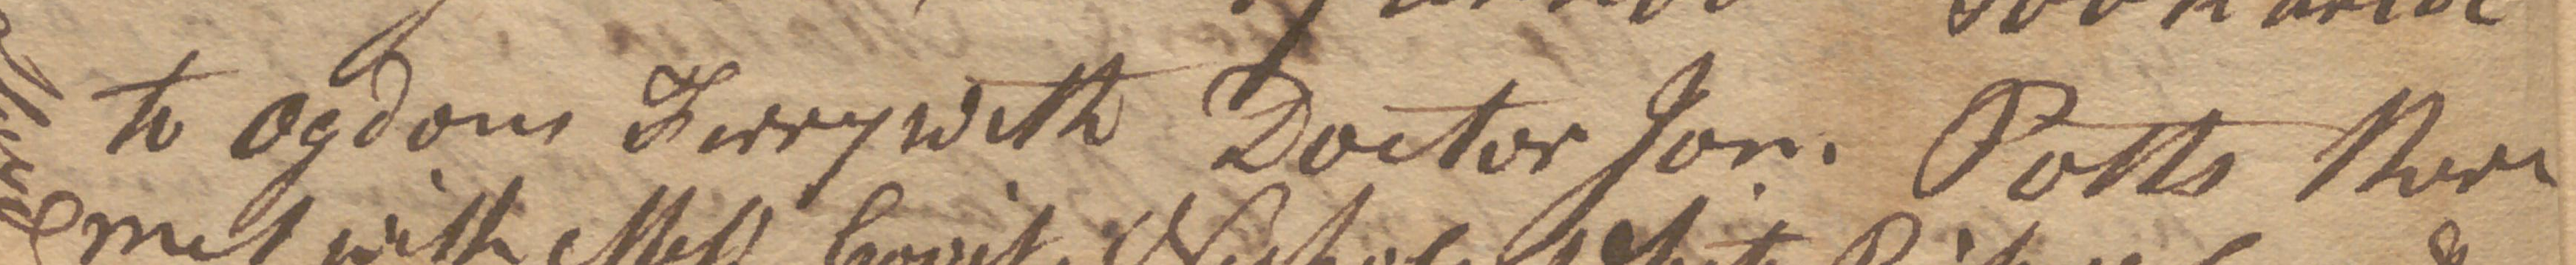to ogdons Ferry with Doctor Jon. Potts then
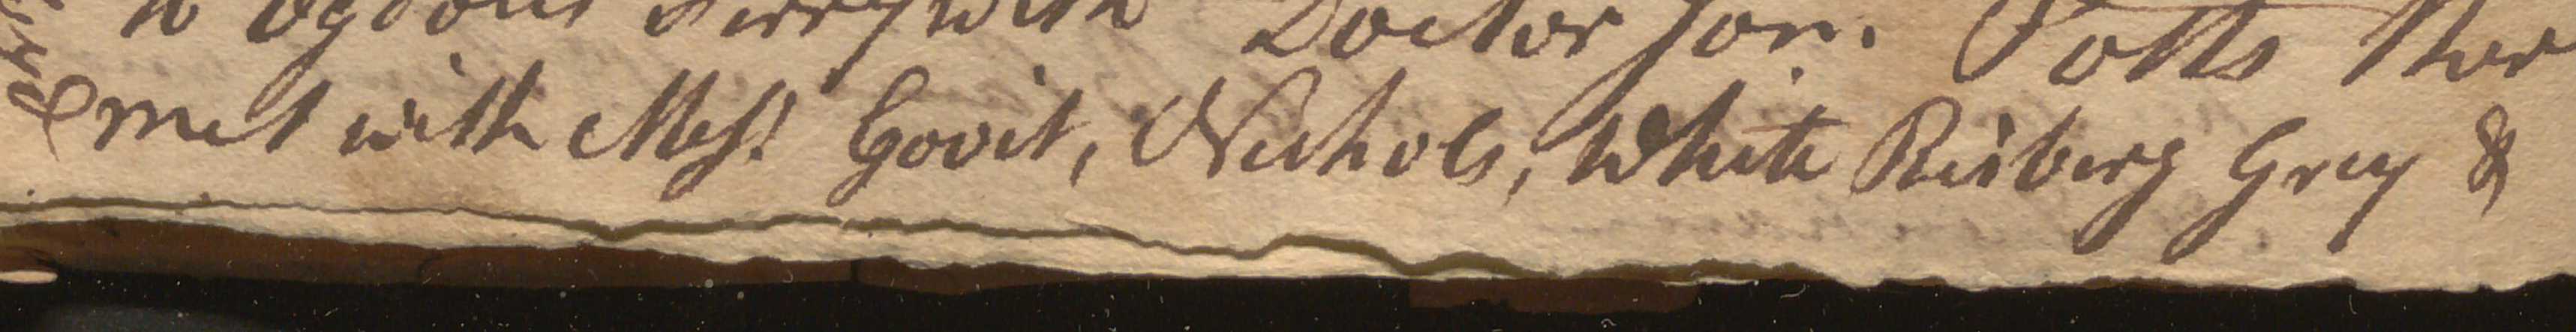met with Mess. Govit, Nichols white Reiberg Grey &
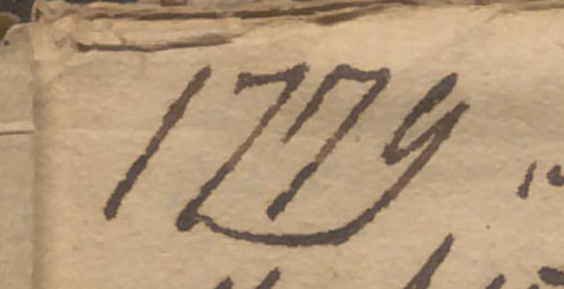1779
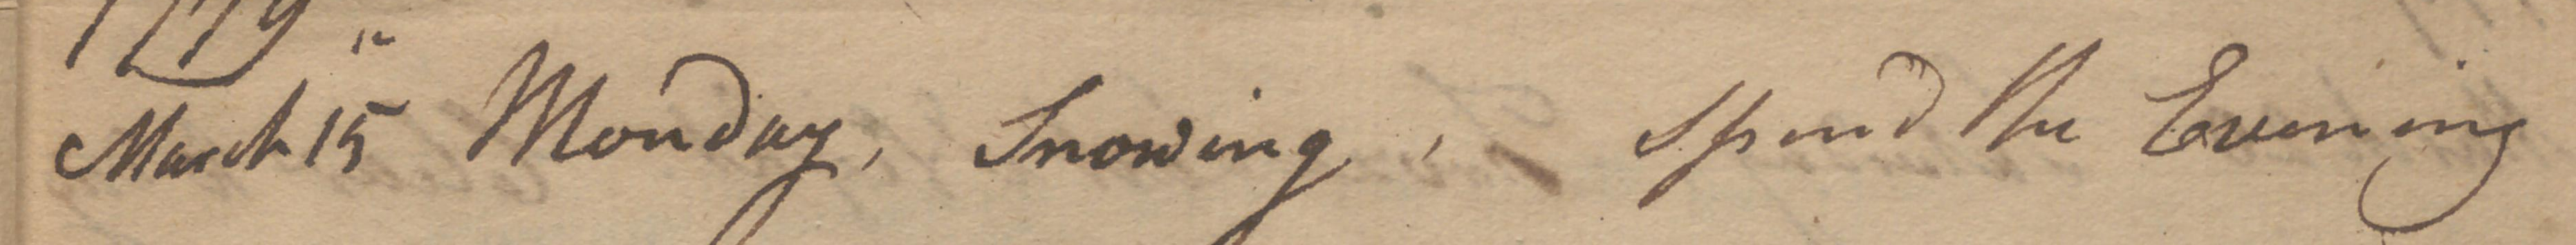March 15^h Monday Snowing spend the Evening
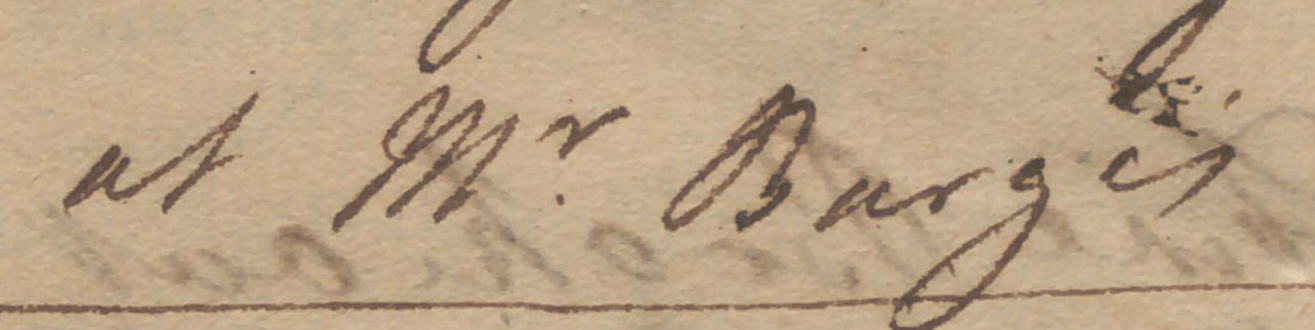at M^r. Barges
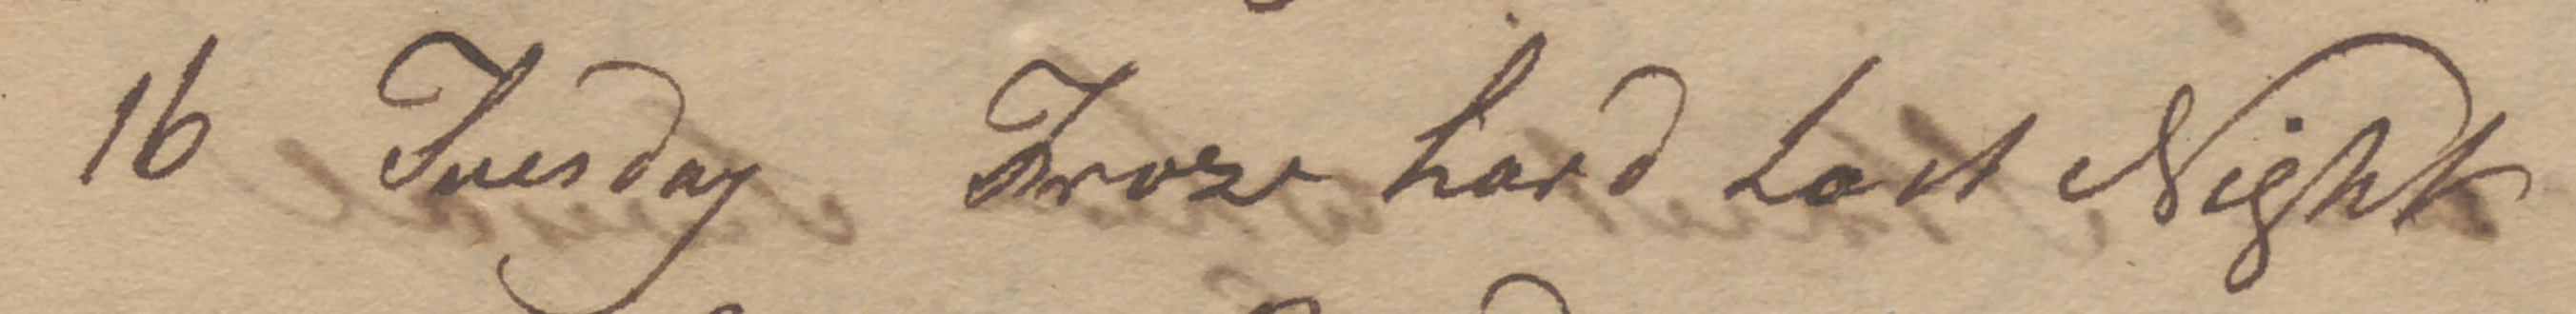16 Tuesday Froze hard Last Night
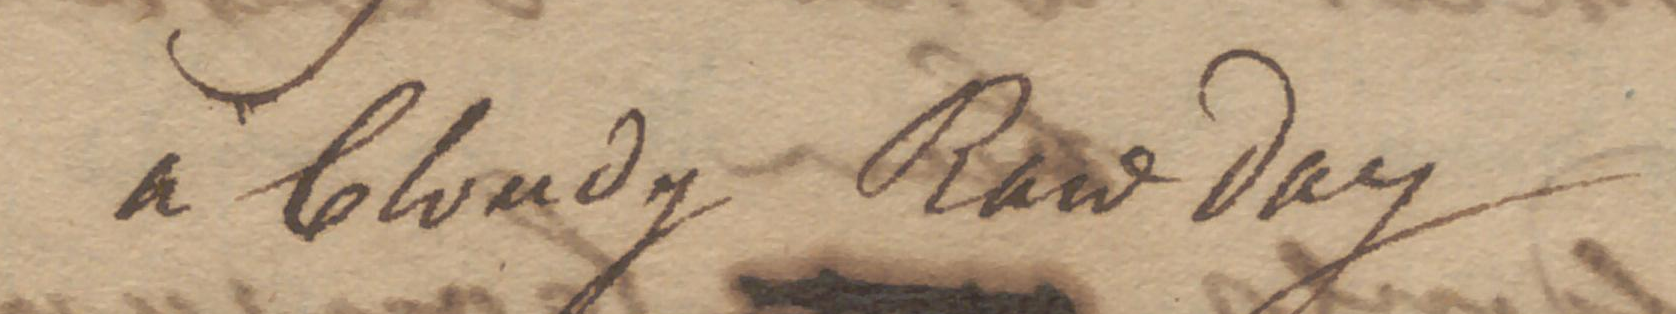a Clondy Raw day
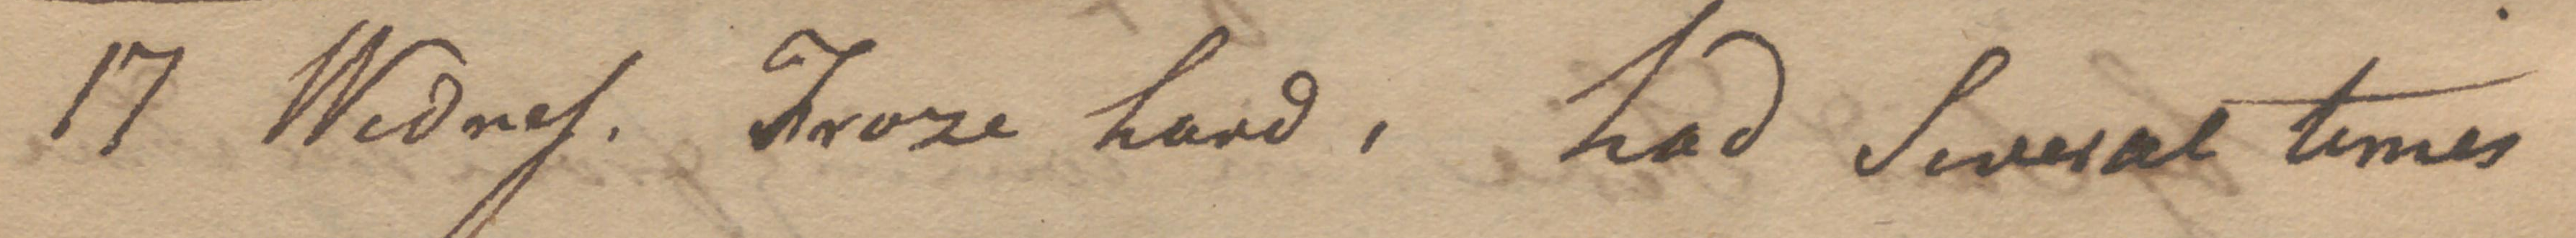17 Wednes. Froze hard, had Several times
